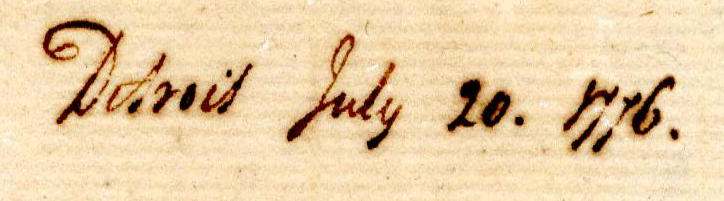Detroit July 20. 1776.
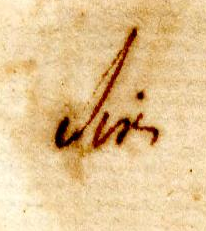Sir
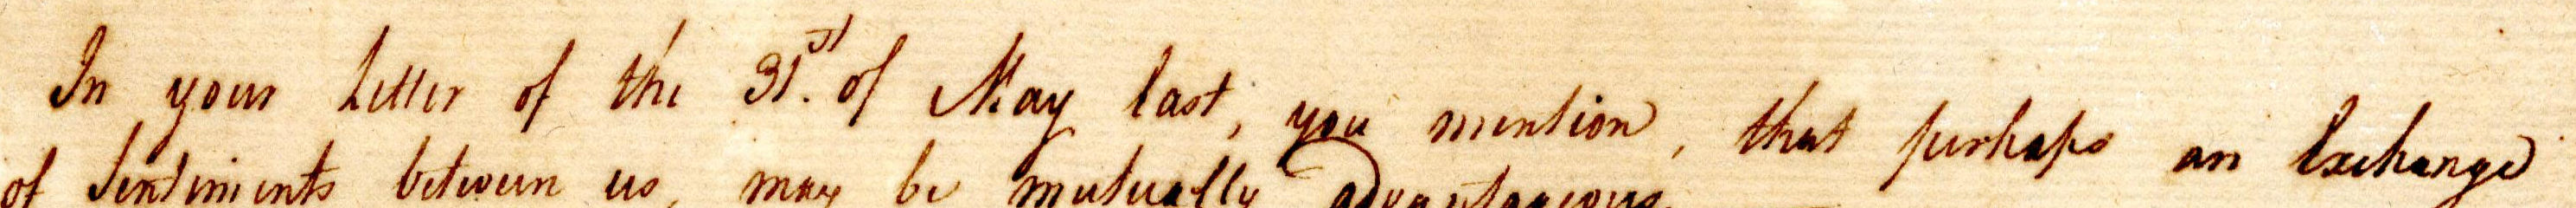In your Letter of the 31^st. of May last, you mention, that perhaps an Exchange
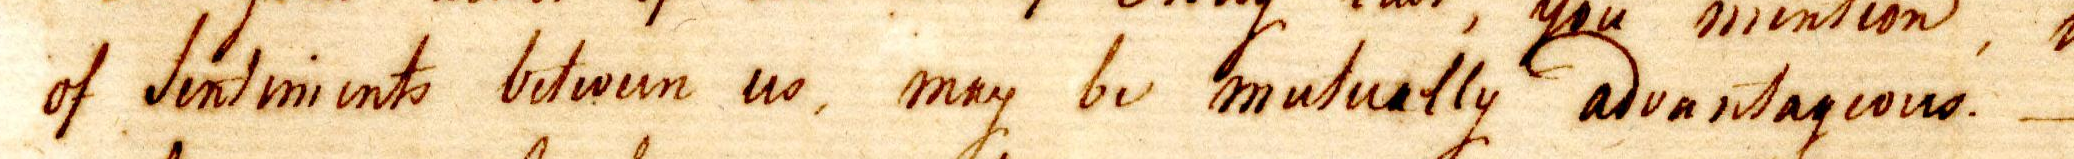of Sentiments between us, may be mutually advantagious.
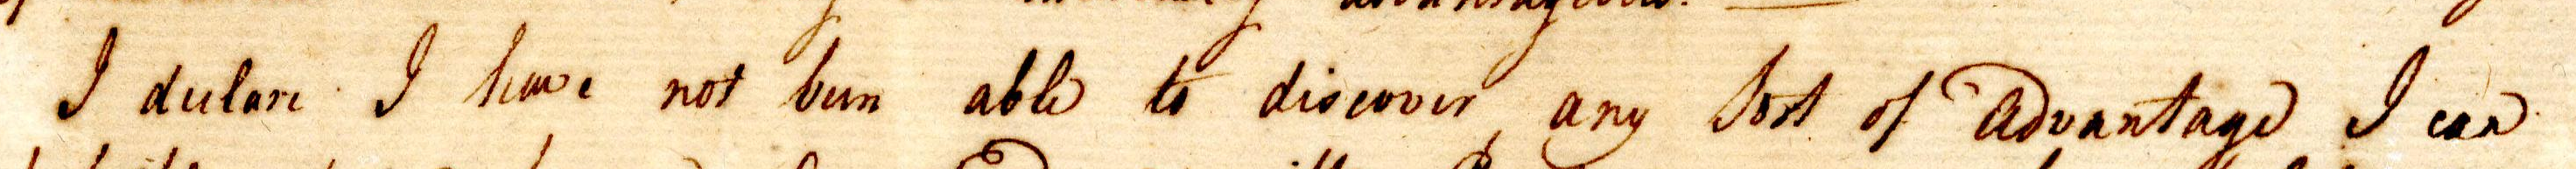I declare I have not been able to discover any Sort of advantage I can
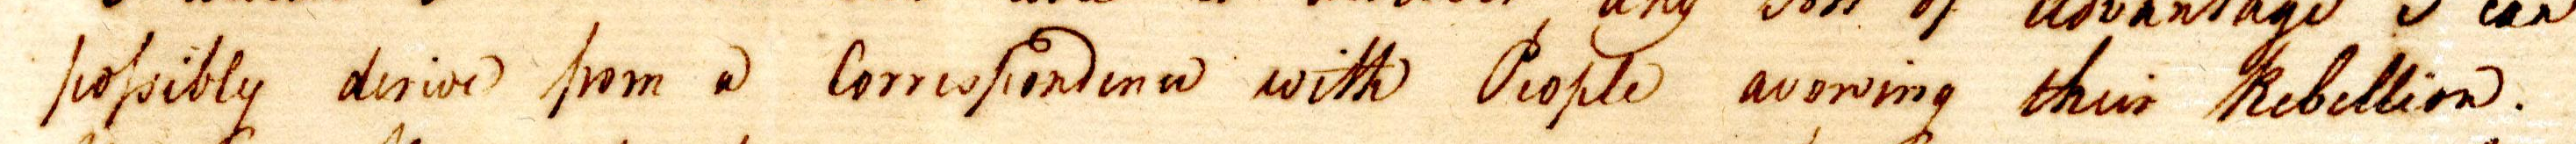possibly derive from a Correspondence with People avowing their Rebellion.
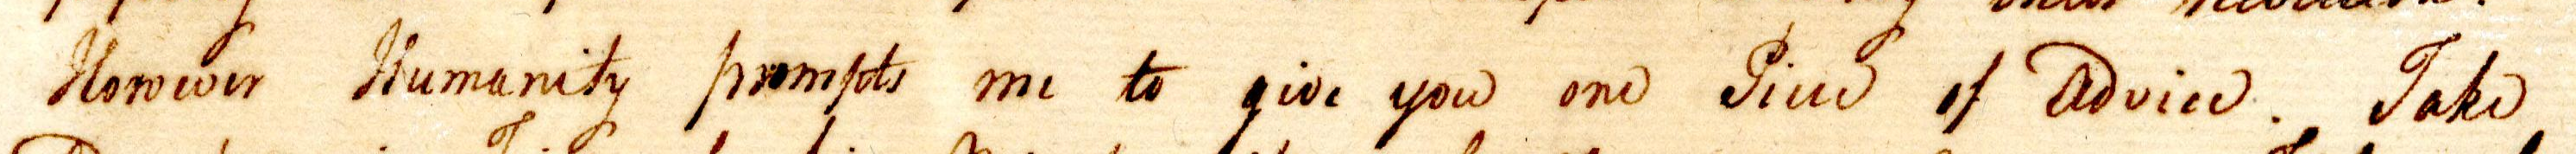However Humanity prompts me to give you one Piece of Advice. Take
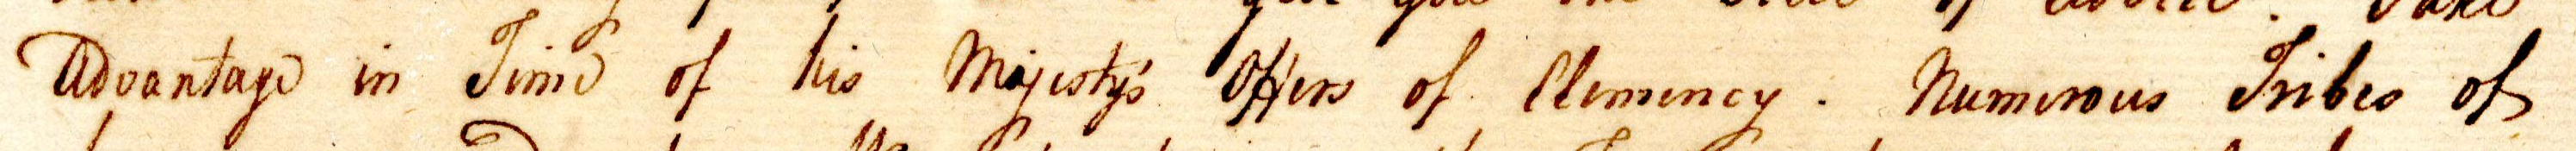advantage in Time of his Majesty's Offers of Clemency. Numerous Tribes of
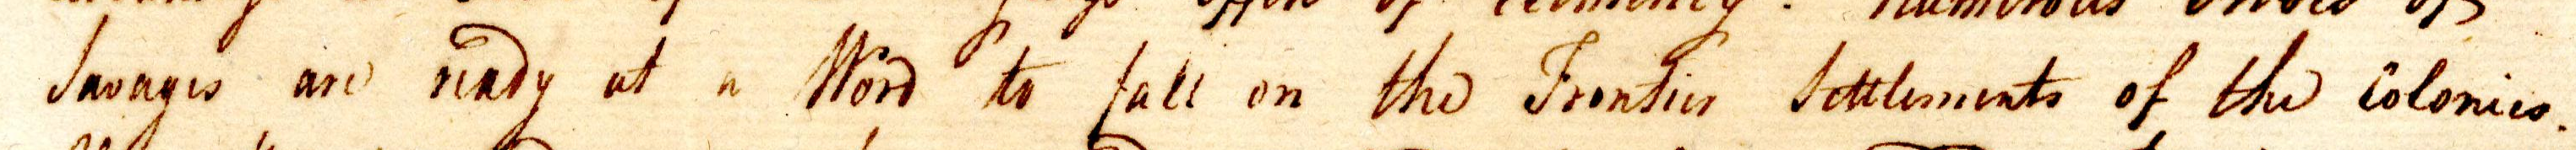Savages are ready at a Word to fall on the Frontier Settlements of the Colonies.
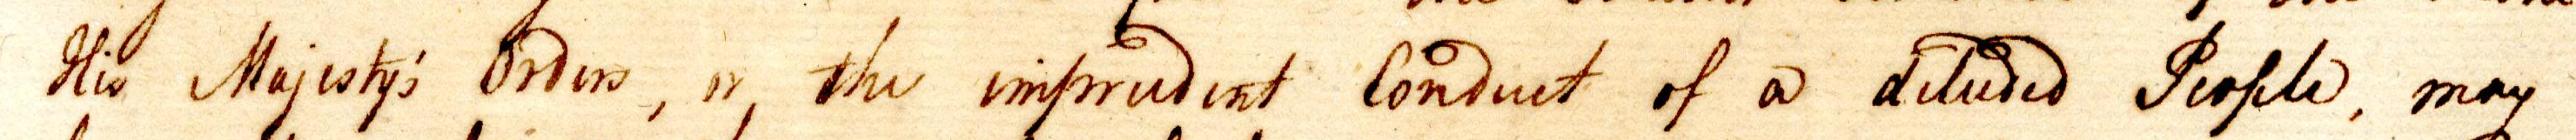His Majesty's Orders, in the imprudent Conduct of a deluded People, may
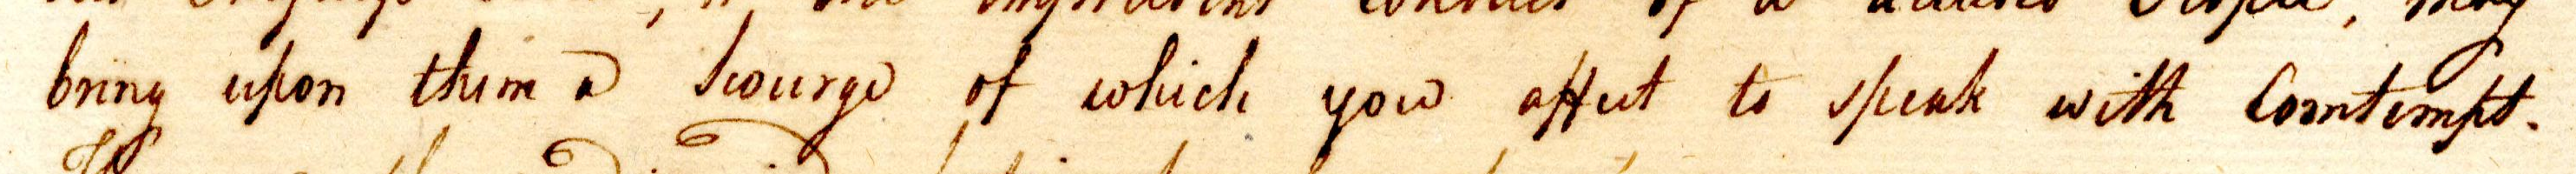bring upon them a Scourge of which you affect to speak with Contempt.
